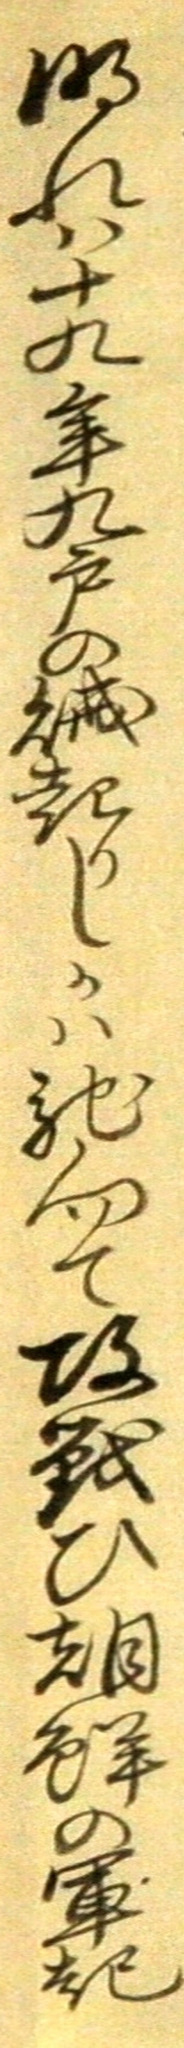明れは十九年九戸の賊起りしかは馳向て攻戦ひ朝鮮の軍起

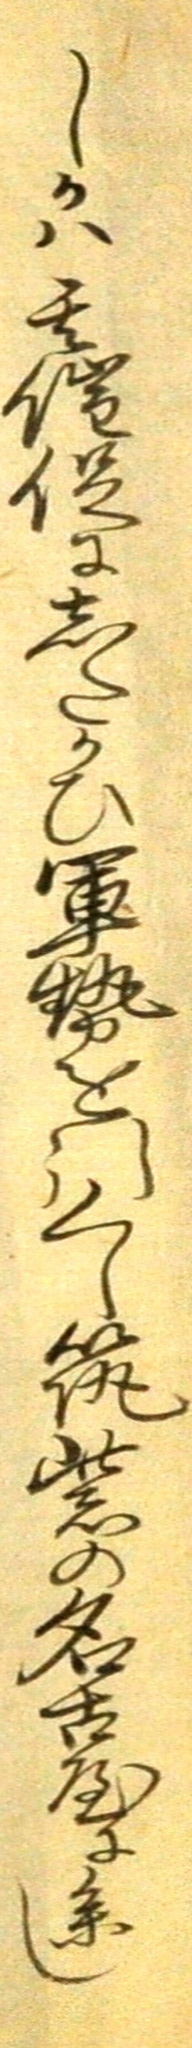しかは其催促にしたかひ軍勢を引くし筑紫の名古屋に参し
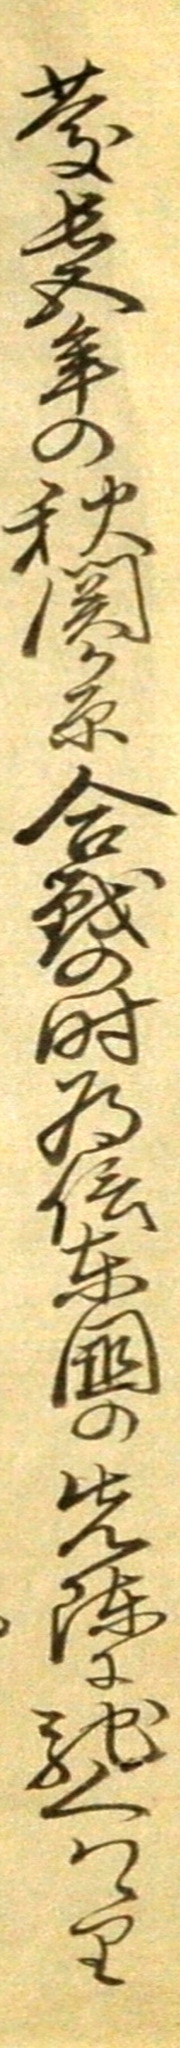慶長五年の秋関か原合戦の時為信東国の先陣に馳くはゝり
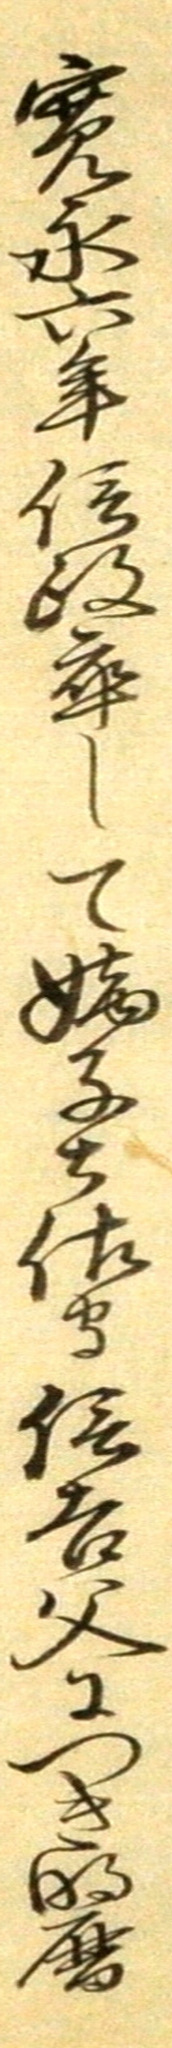寛永六年信政卒して嫡子土佐守信吉父につき明暦
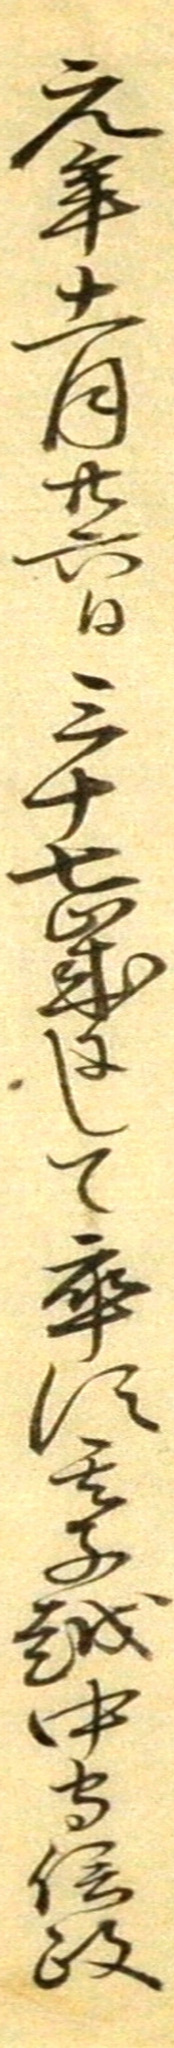元年十一月廿六日三十七歳にして卒す其子越中守信政
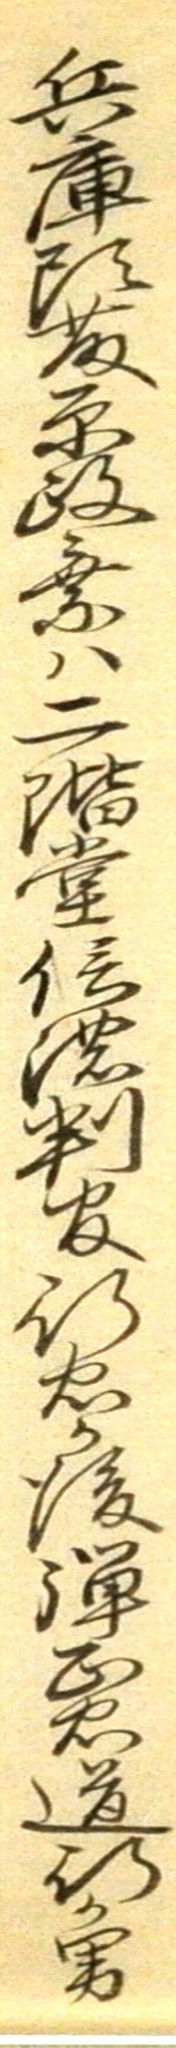兵庫頭藤原政乗は二階堂信濃判官行忠か後弾正忠道行か男
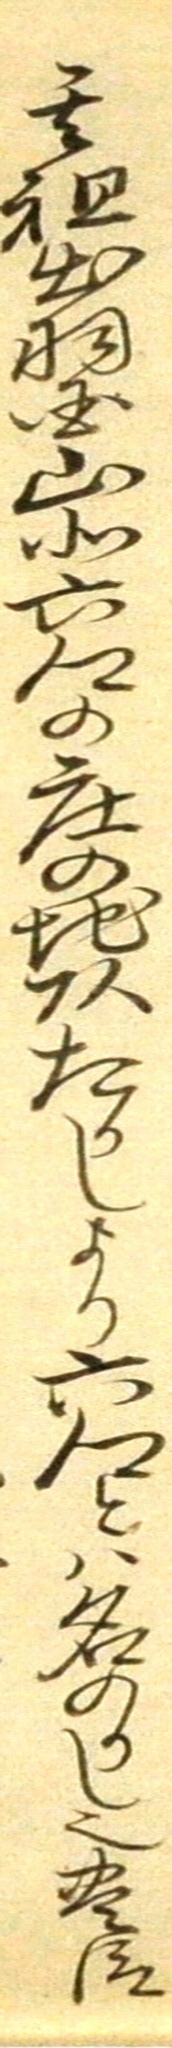其祖出羽国山北六郷の庄の地頭たりしより六郷とは名のりし也豊臣
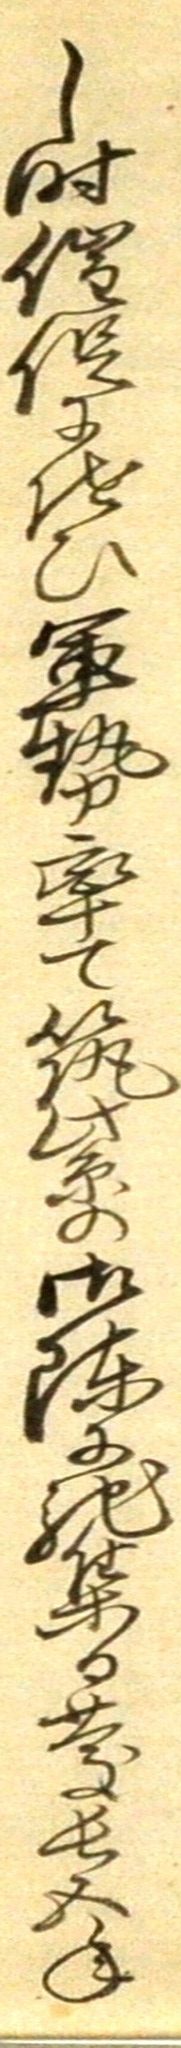し時催促に随ひ軍勢率て筑紫の御陣に馳集る慶長五年
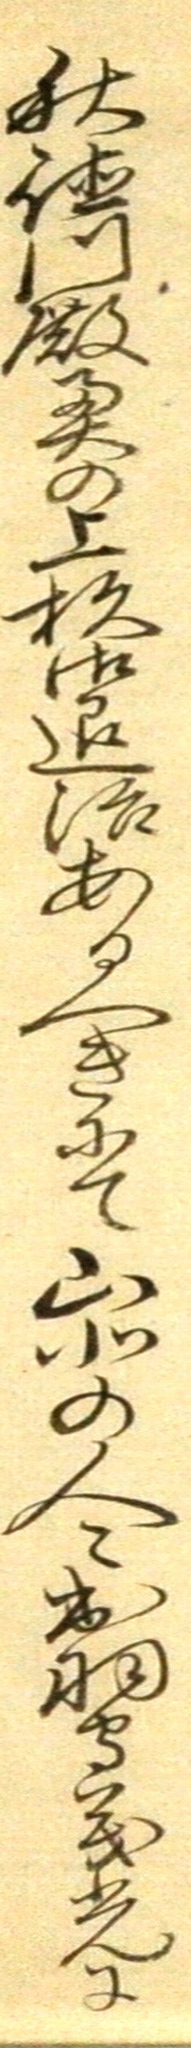秋徳川殿奥の上杉御退治あるへきにて山北の人々出羽守義光に
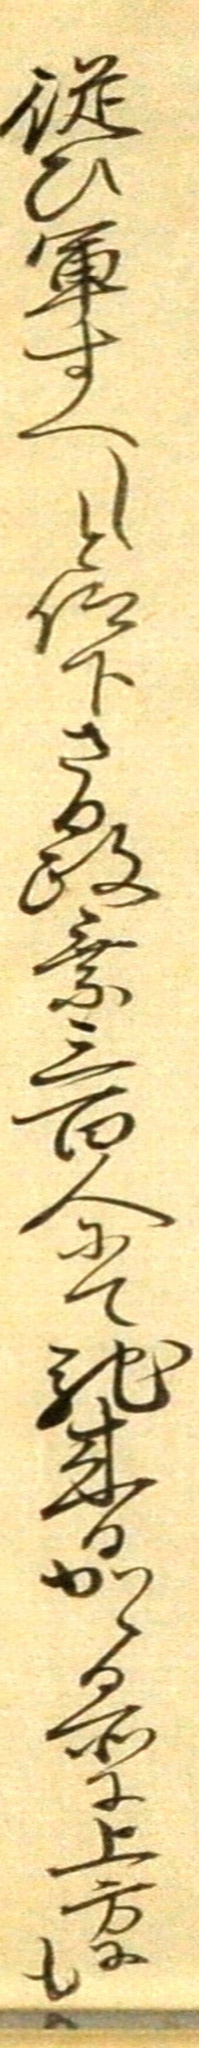従ひ軍すへしと仰下さる政乗三百人にて馳来るかゝる所に上方にも
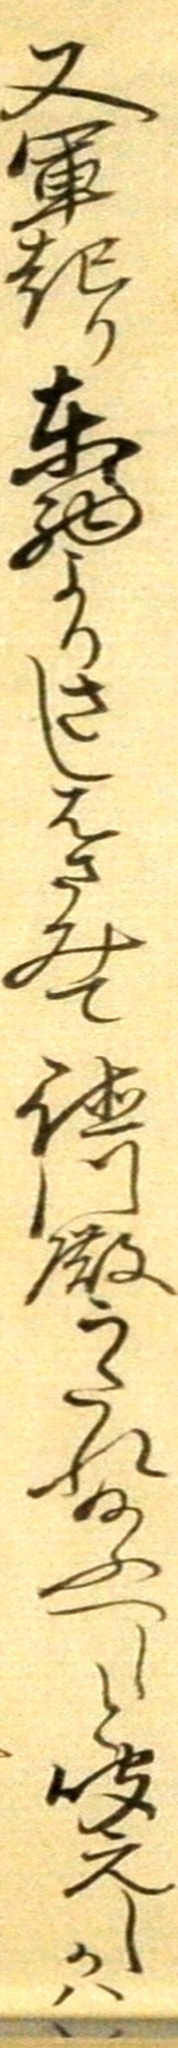又軍起り東西よりさしはさみて徳川殿うたれ給ふへしと聞えしかは
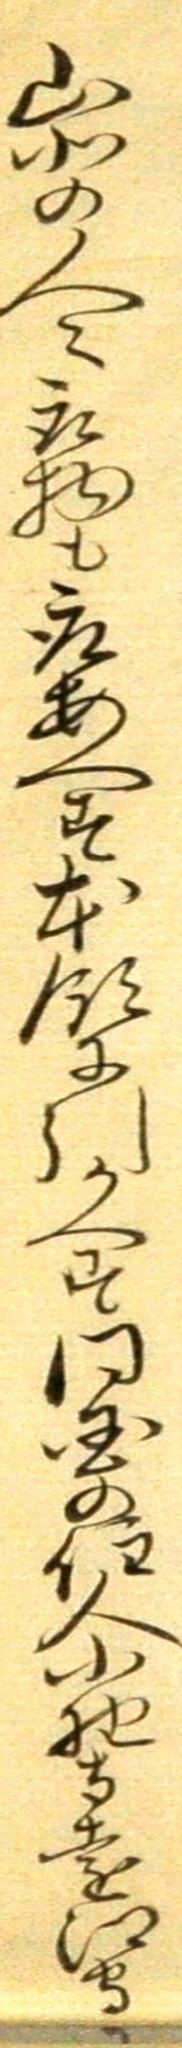山北の人々取物も取あへす本領に引かへす同国の住人小野寺遠江守
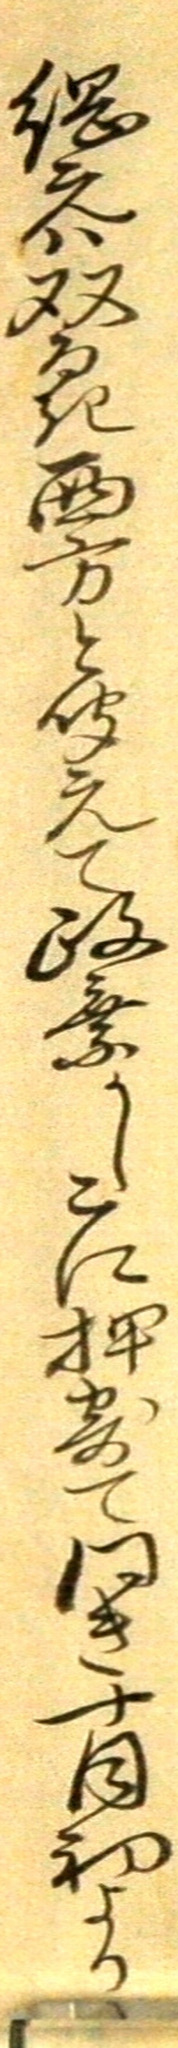綱元は双なき西方と聞えて政乗かしこに押寄て同き十月初より

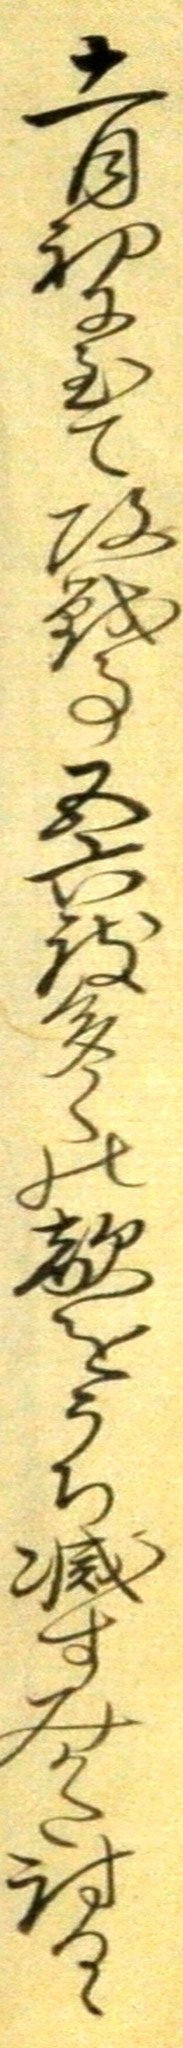十一月初に至て攻戦事五六度多くの敵をうち滅すみかた討るゝ
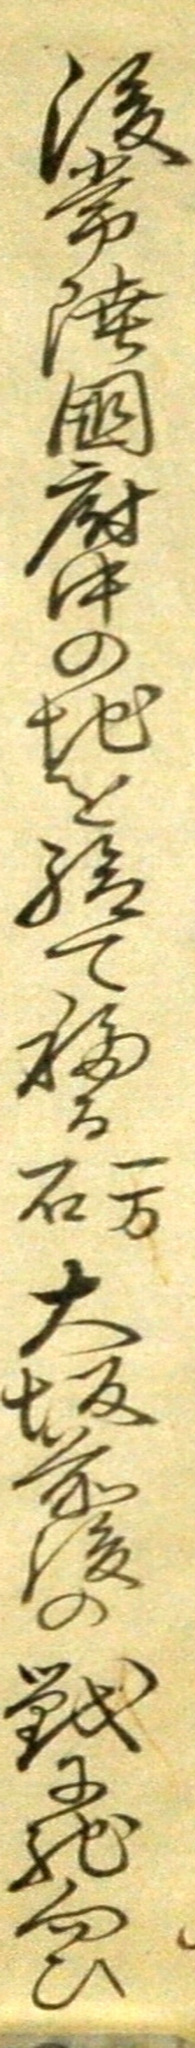後常陸国府中の地を給て移る一万石大坂前後の戦に馳向ひ
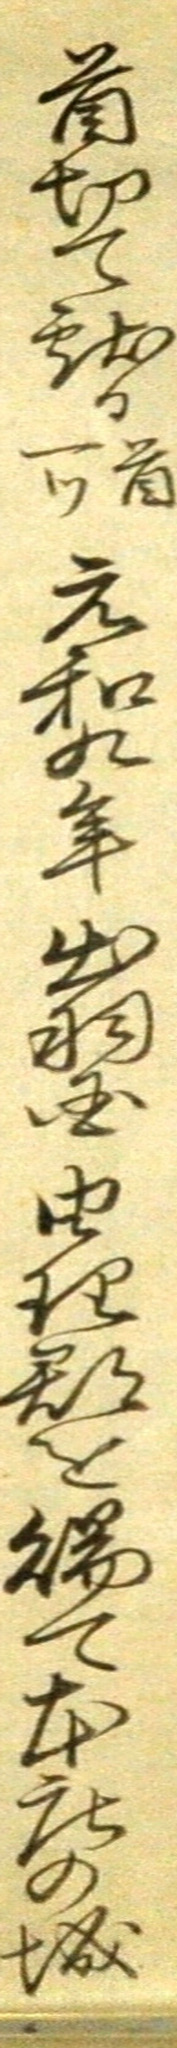首切て献る首一ツ元和九年出羽国由利郡を賜て本庄の城
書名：藩翰譜（九・下）
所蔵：伊那市立高遠町図書館・合同会社AMANE
